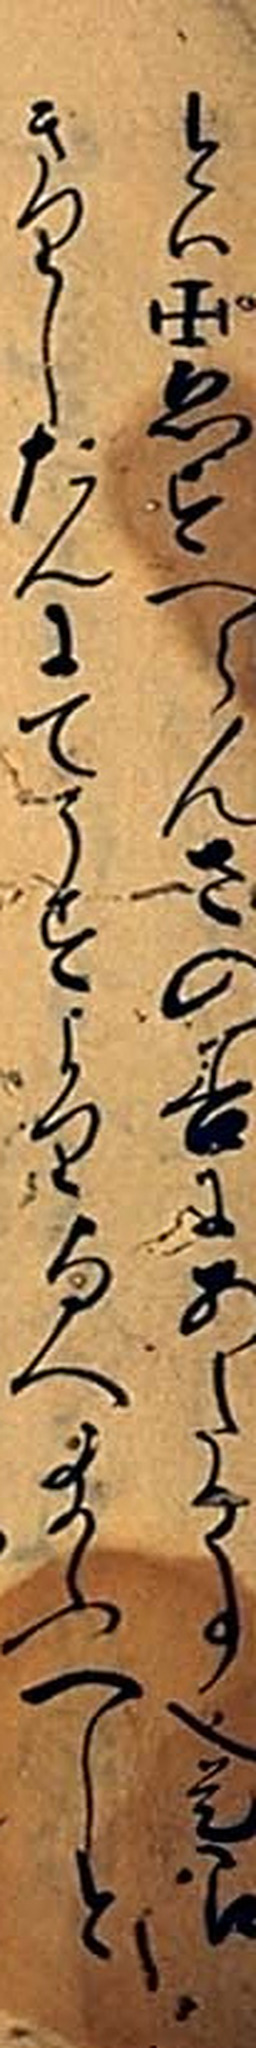きりしたんにてうすより与へ給ふへしと
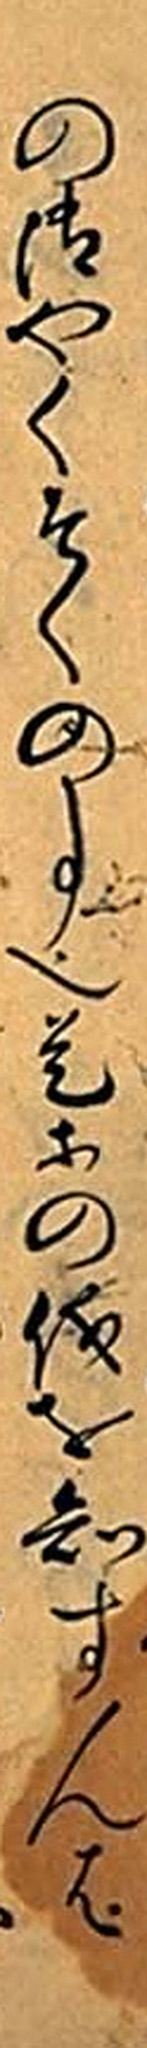の御やくそくの事也是等の儀を知すんは
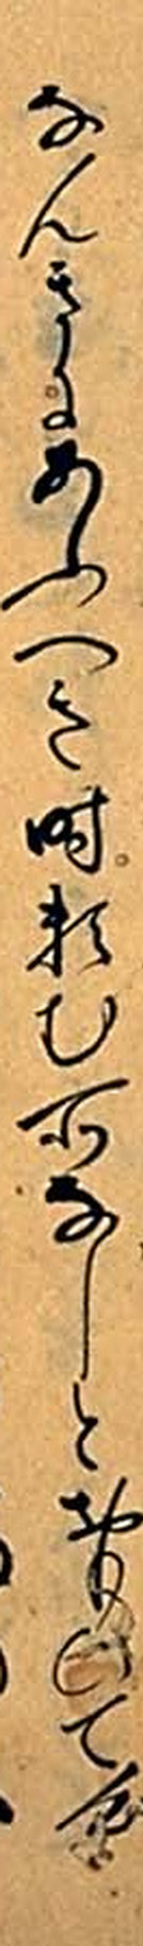なんきにあふへき時頼む所なしとおもひて心
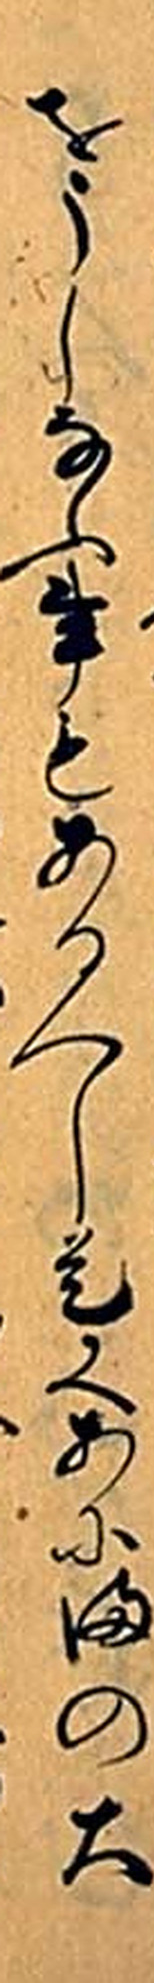をうしなふ事もあるへし是又あにまの大
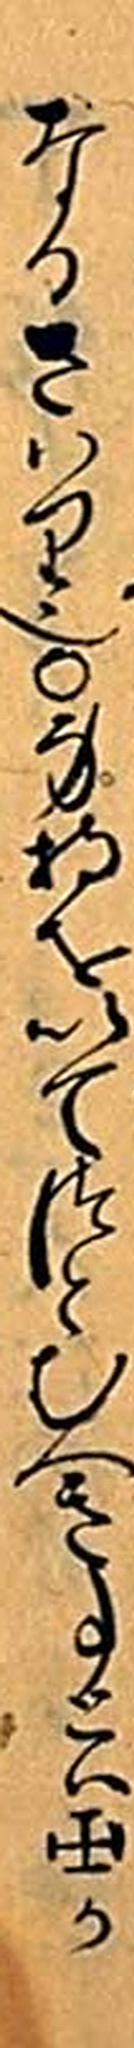なるさはり也○身持を以てつとむへき事とは☩か
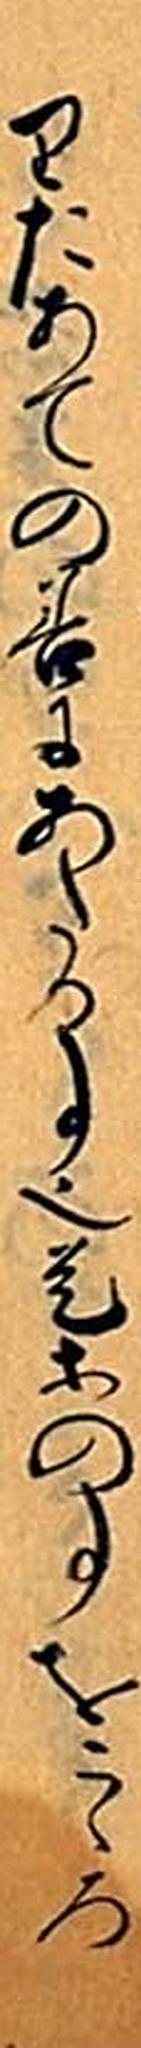りたあての善にあたる事也是等の事をこゝろ
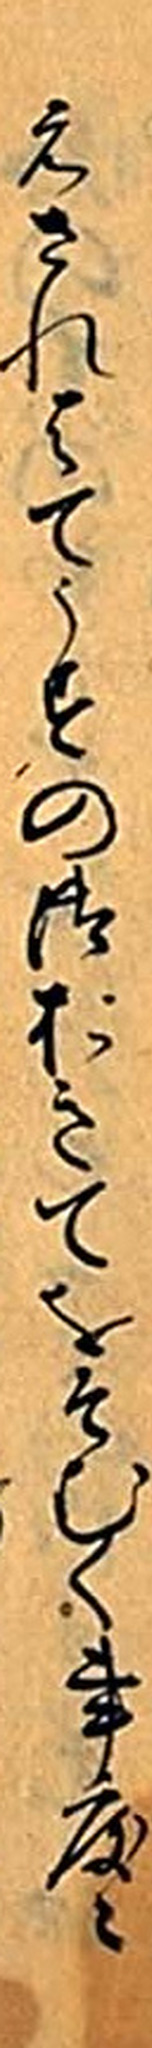えされはてうすの御おきてをそむく事度々
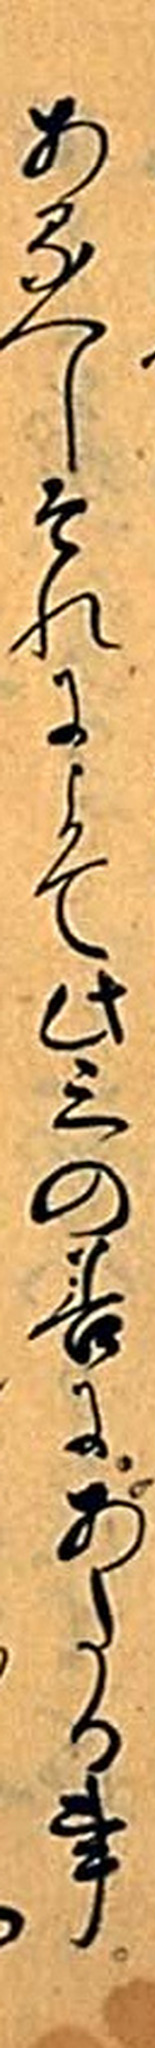あるへしそれによて此三の善にあたる事
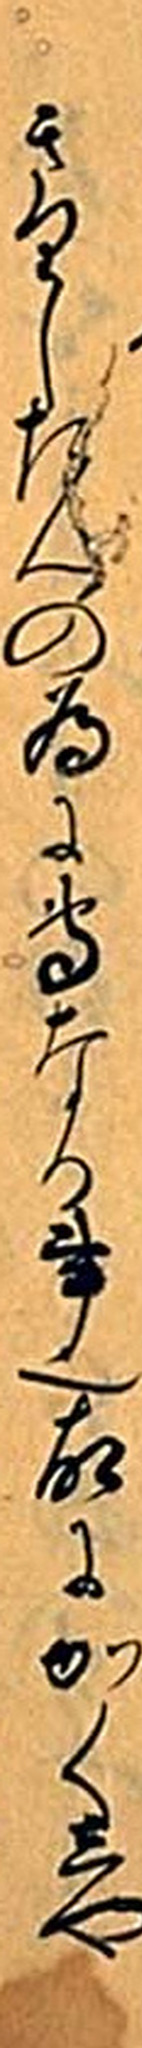きりしたんの為に専なる事也故にかくしや
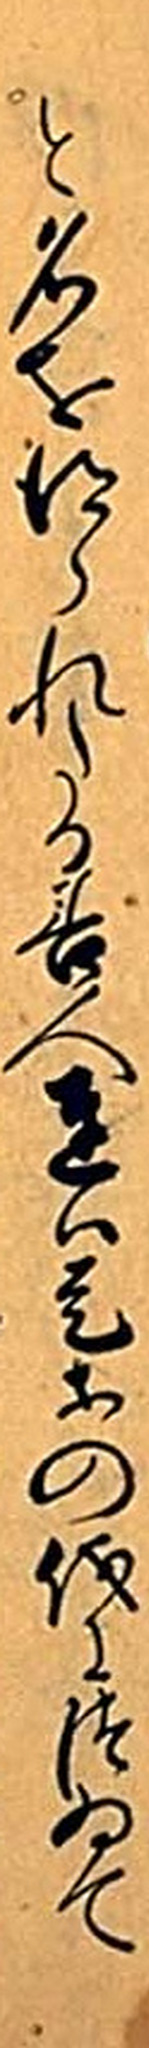と名を仰られたる善人達は是等の儀につゐて
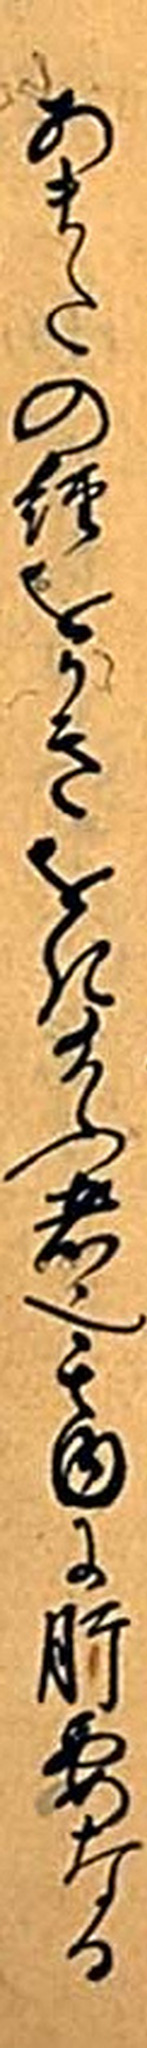あまたの経をかきをき給ふ者也其内に肝要なる
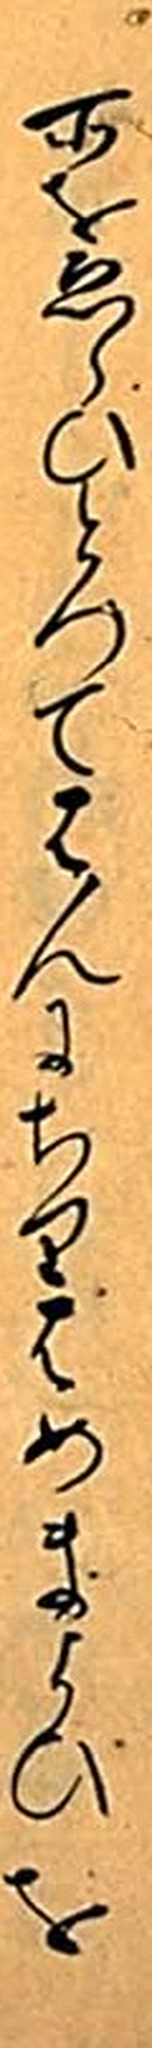所をゑらひとつてはんにちりはめまよひを
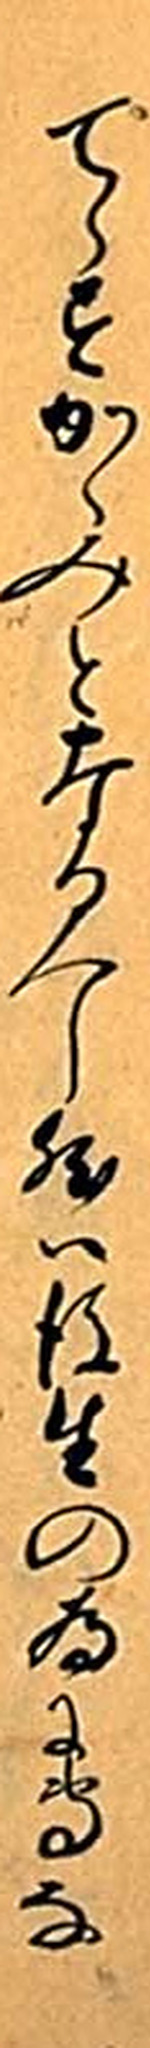てらすかゝみとなるへし然は後生の為に専な
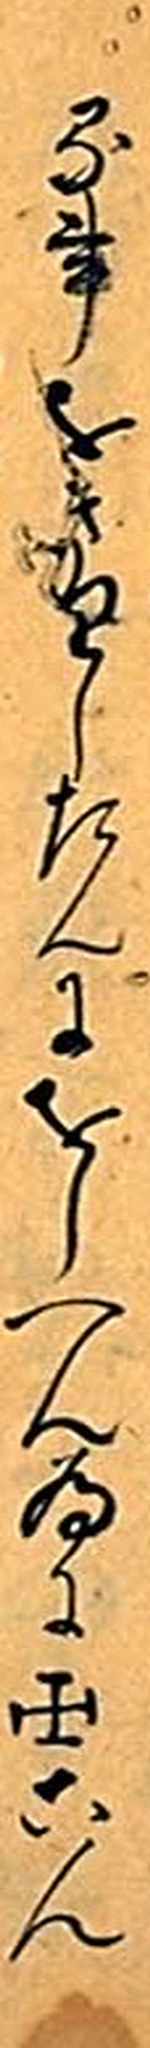る事をきりしたんにをしへん為に☩こん
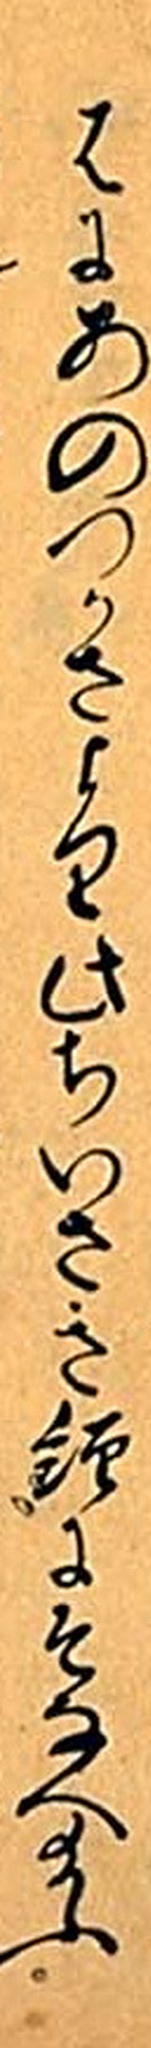はにあのつかさより此ちいさき経にそなへ給ふ
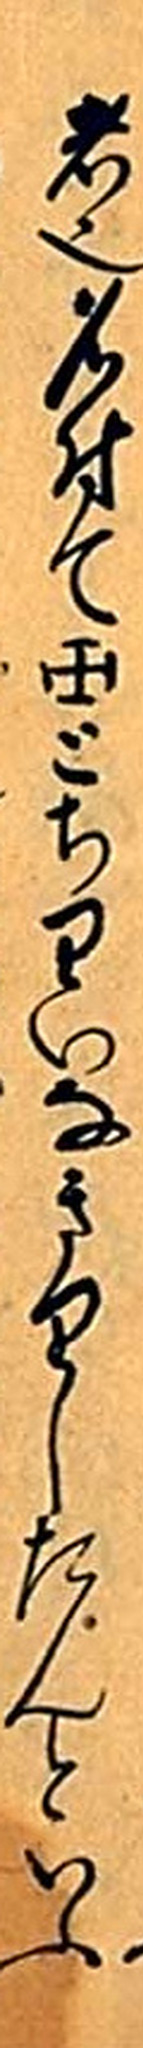者也名付て☩とちりいなきりしたんといふ
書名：ドチリナ・キリシタン
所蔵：東京大学総合図書館 / General Library in the University of Tokyo
